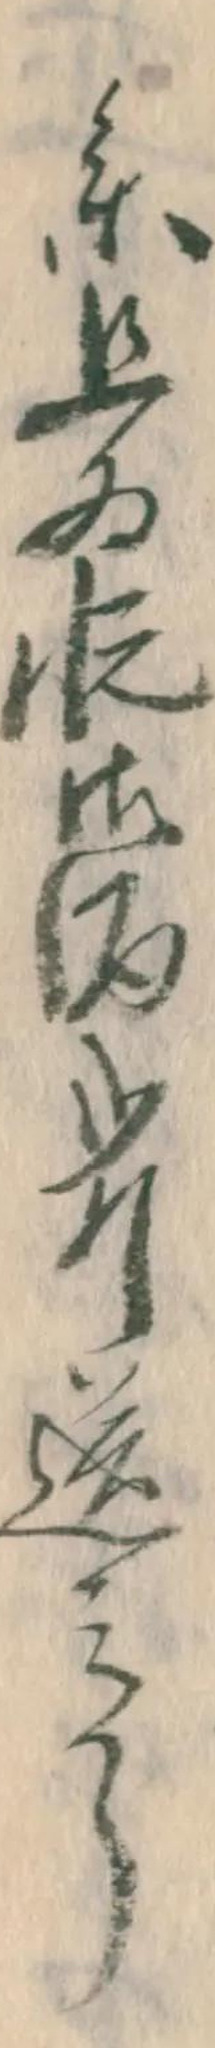参上為祝御酒弐升送之了
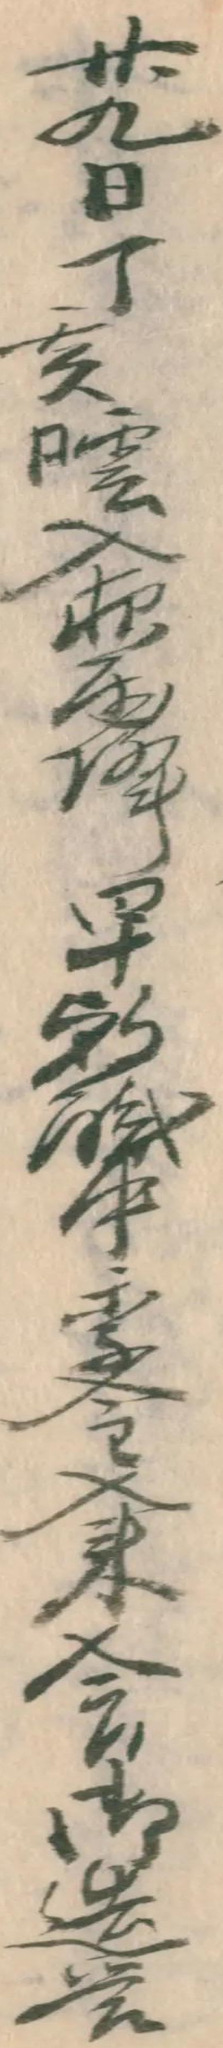廿九日丁亥曇入夜雨降早朝職中季令入来今日御造営
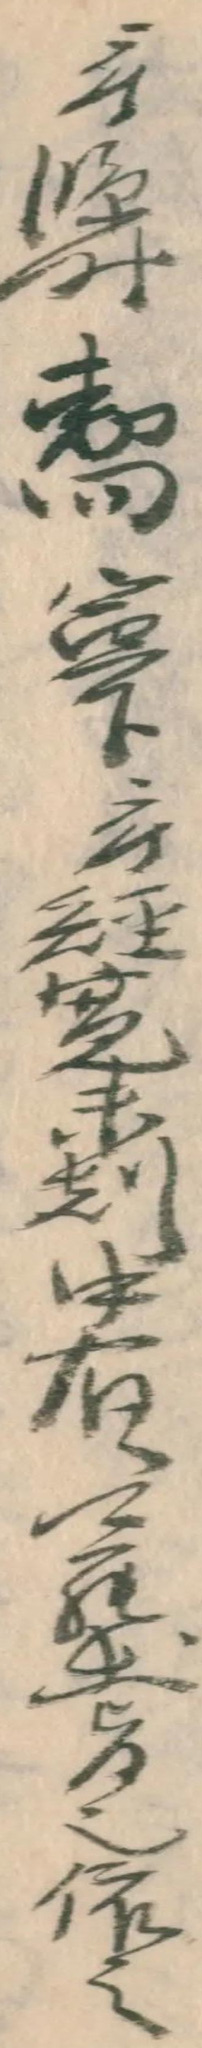ニ付臨時勅問宣下ニ付経寛未刻中宿へ可罷出旨也依之
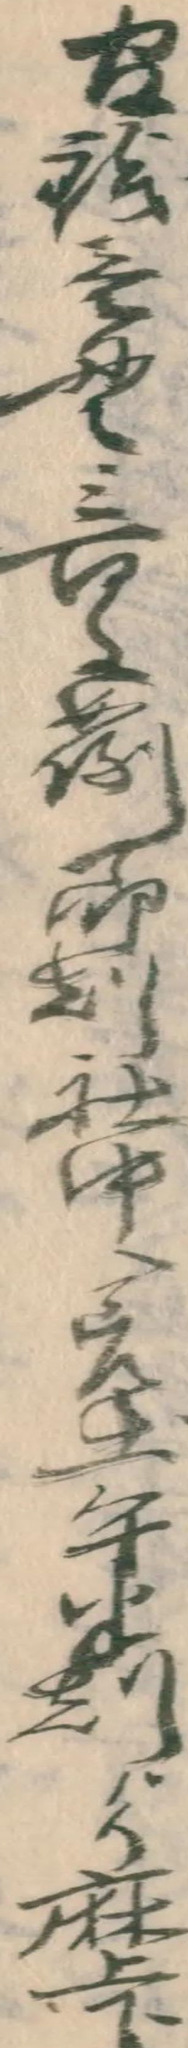官銭壱貫三百文如例即刻社中へ差出午半刻より麻上下
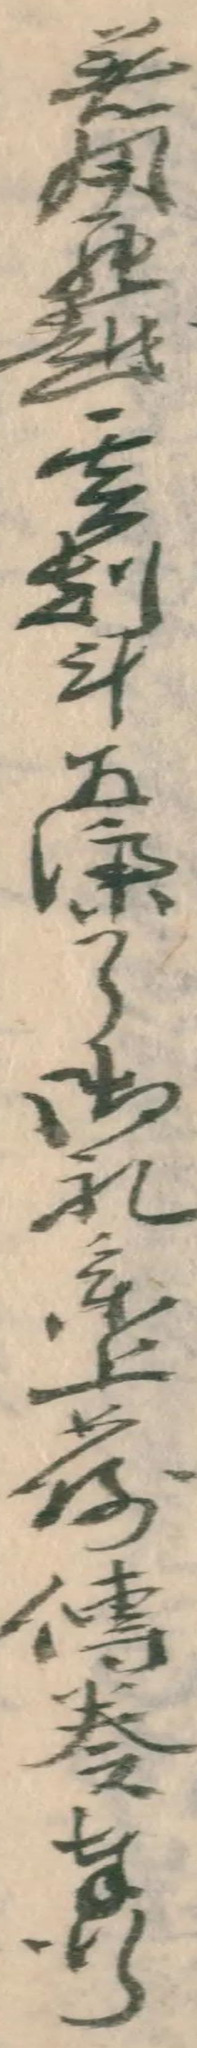着用罷越亥刻斗相済了御礼参上如例傳奏奉行
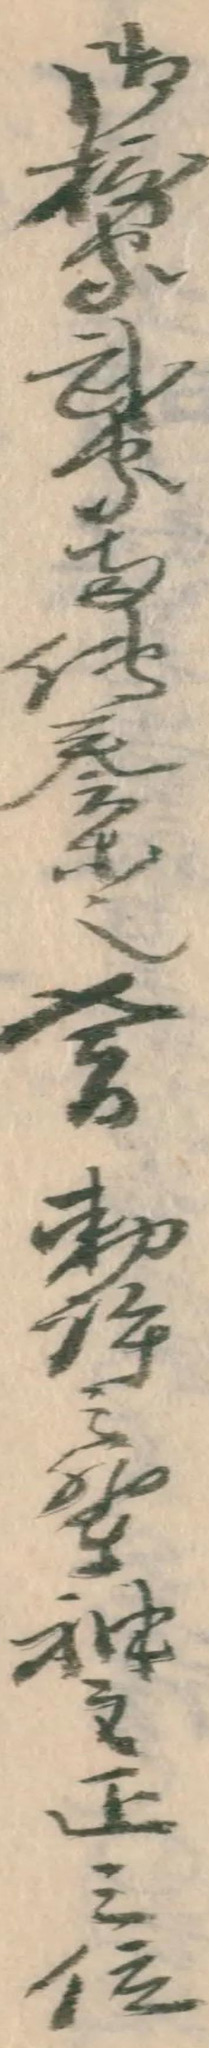御摂家武家両傳奏等也今日勅許之輩神主正三位
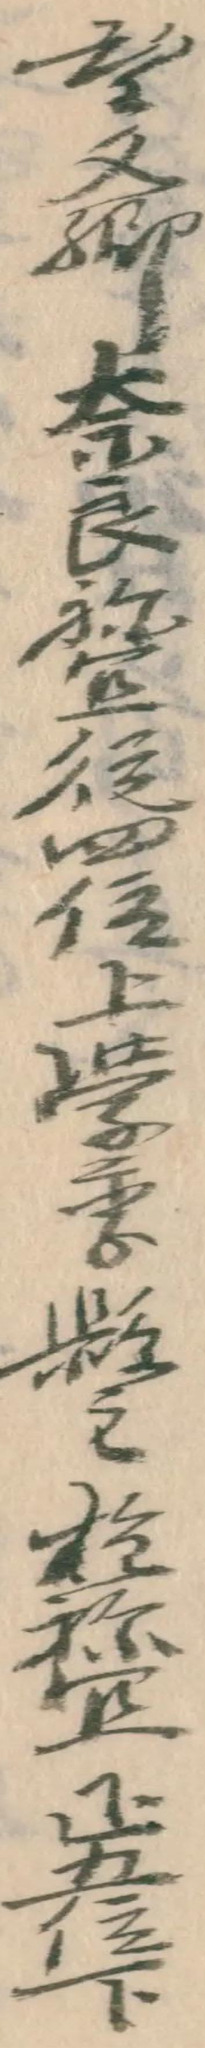望久卿奈良称宜従四位上學季県主権称宜正五位下
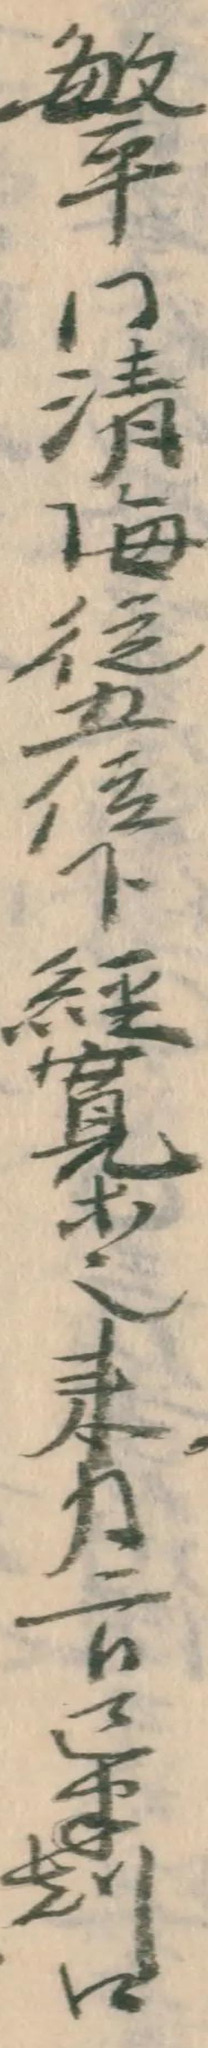敏平同清海従五位下経寛等也来月二日巳半刻口
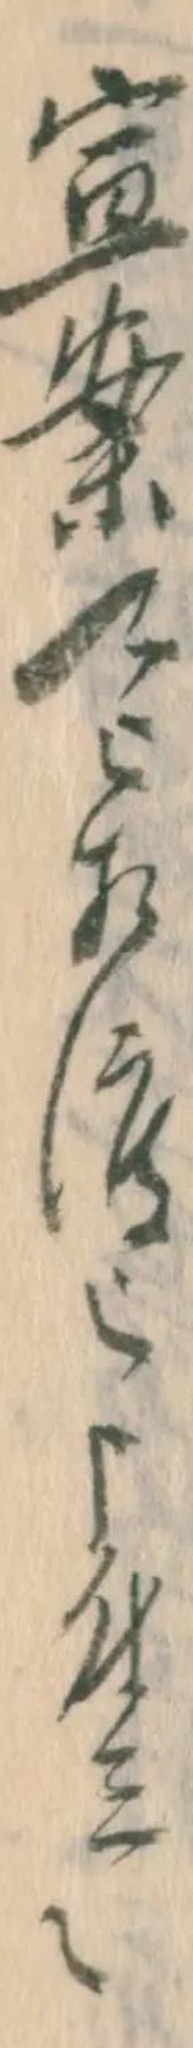宣案可被相渡被申付云々
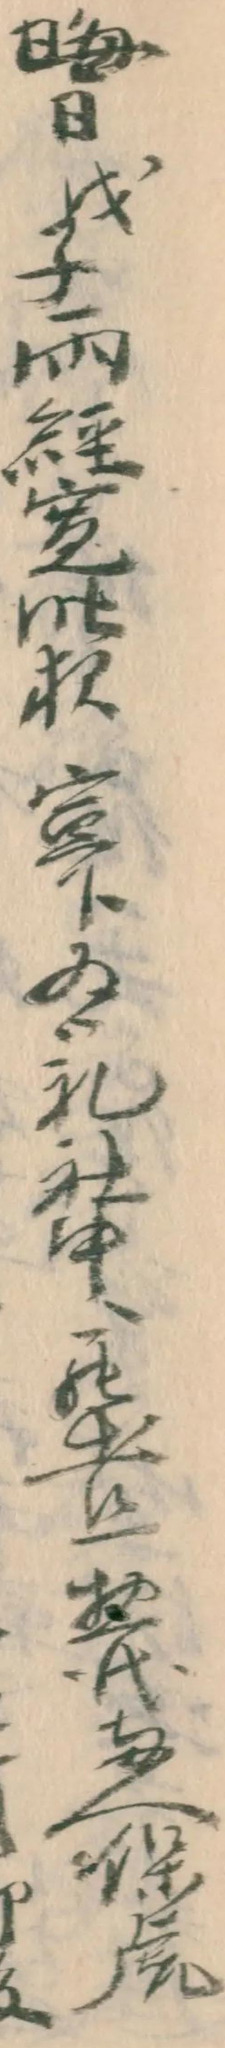晦日戊子雨経寛昨夜宣下為御礼社中へ罷出候一惣代両人保虎
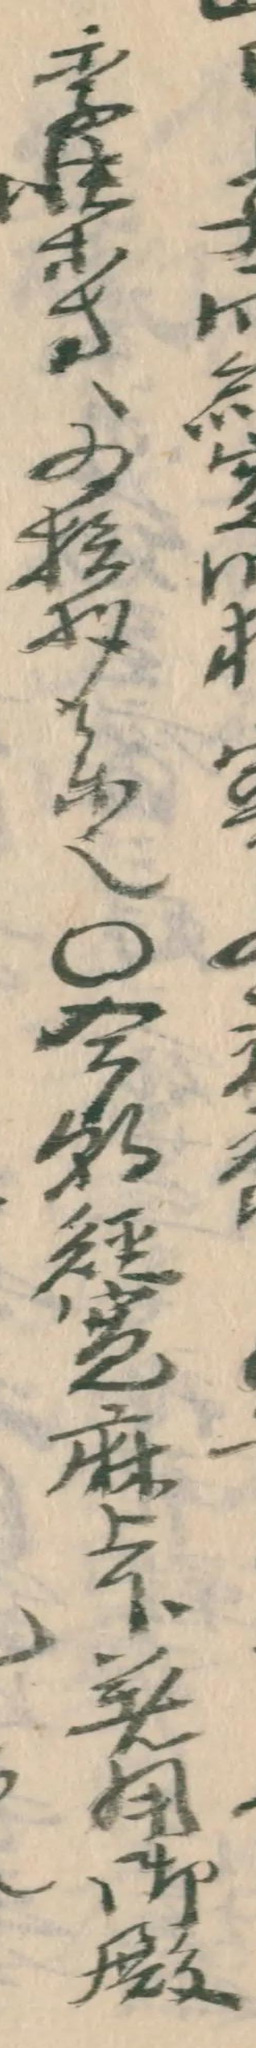季快等方へ為挨拶参也〇今朝経寛麻上下着用御殿
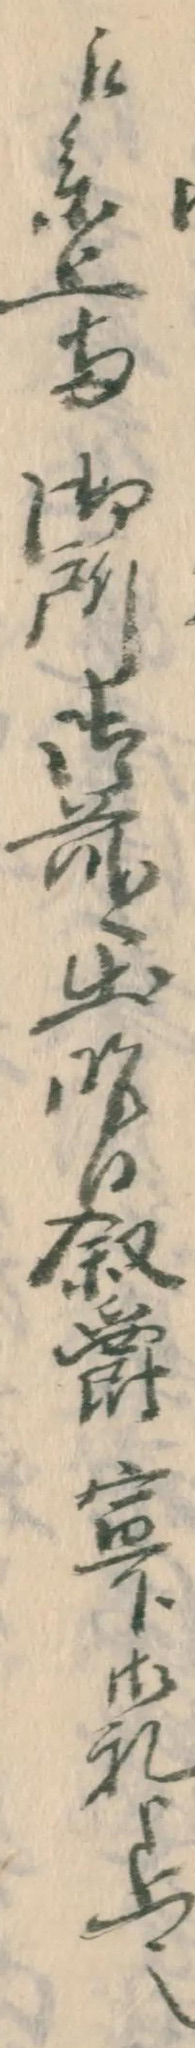え参上両御所御前ヘ出昨日叙爵宣下御礼申上也
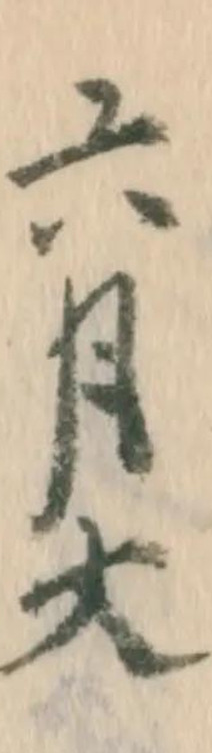六月大
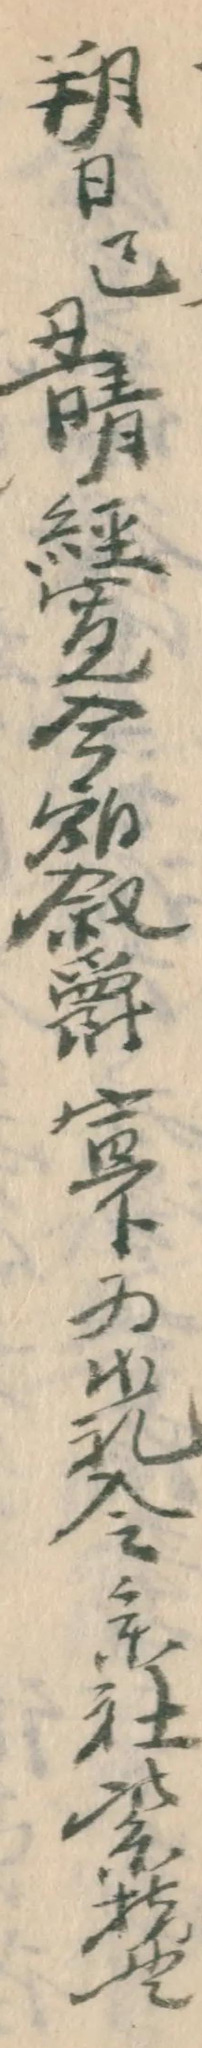朔日己丑晴経寛今朝叙爵宣下為御礼令参社紫指貫
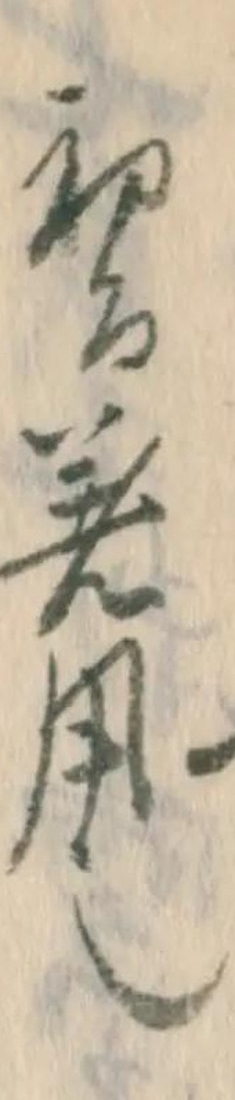初而着用也
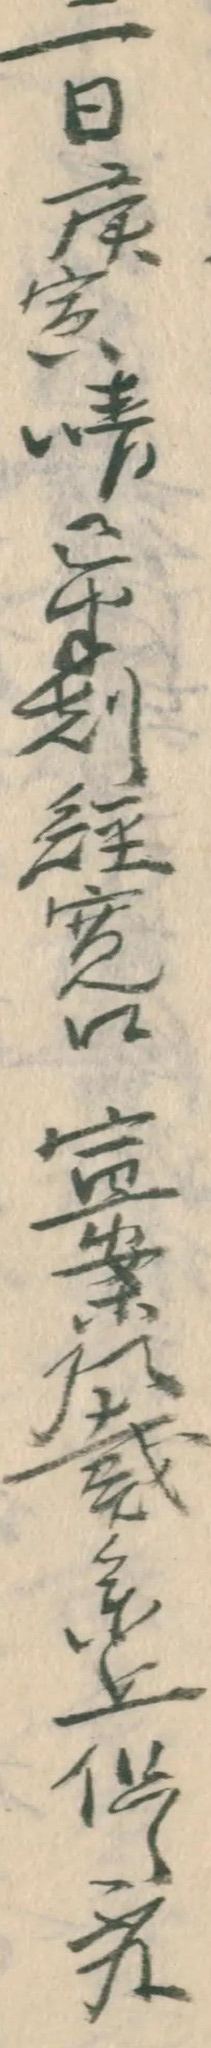二日庚寅晴巳半刻経寛口宣案頂戴参上但し不及
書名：賀茂社記録. 第67冊
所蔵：国立国会図書館 National Diet Library, JAPAN
